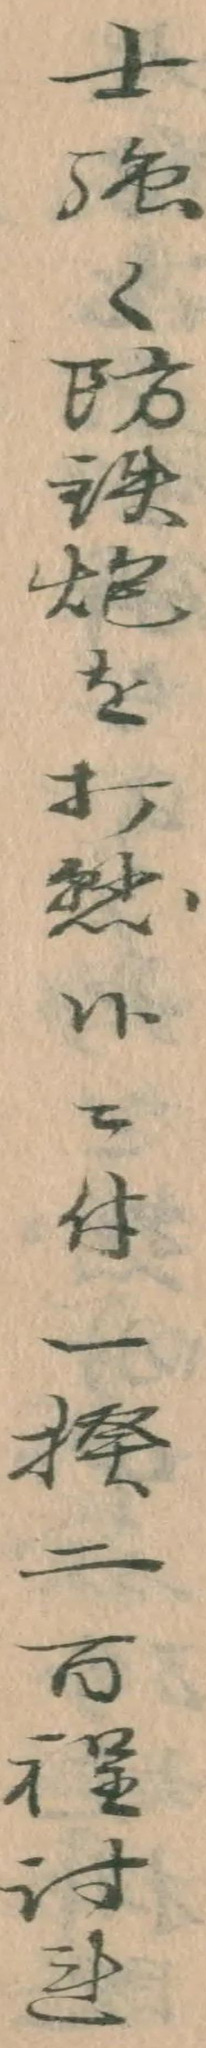士強く防鉄炮を打懸候に付一揆二百程討れ
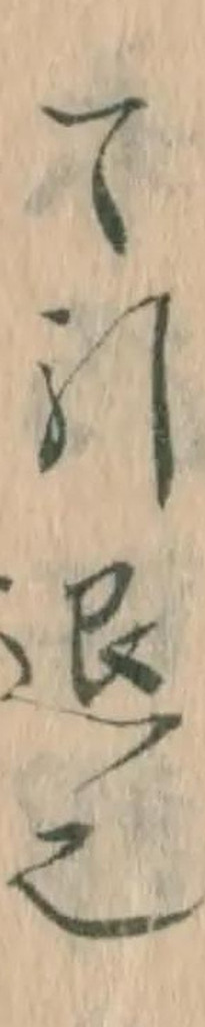て引退也
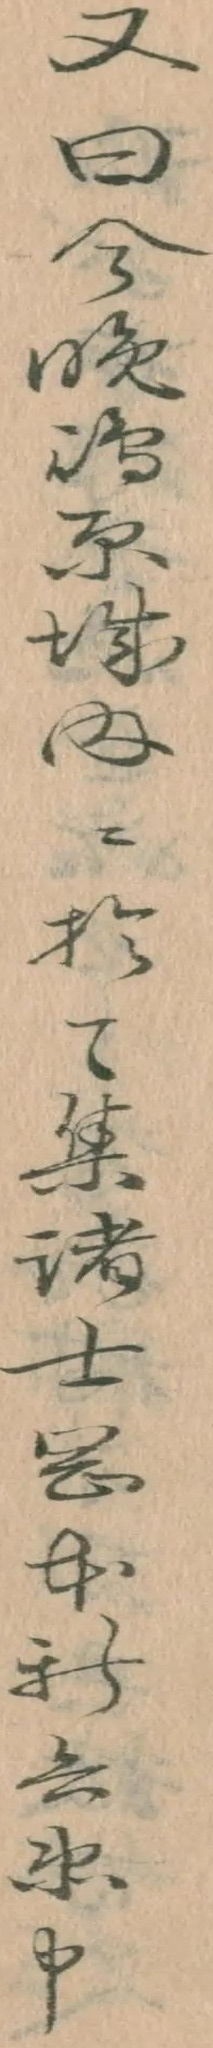又日今晩島原城内に於て集諸士岡本新兵衛申
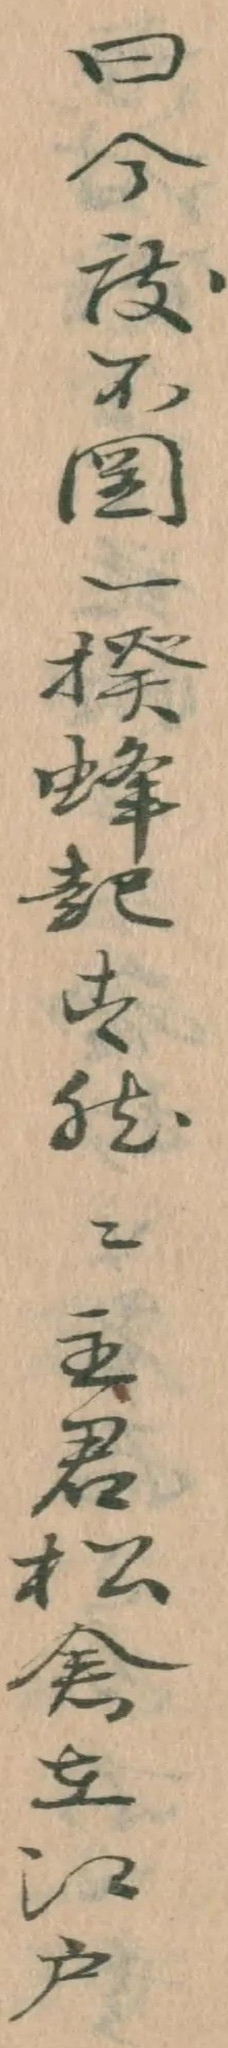日今度不図一揆蜂起す然に主君松倉在江戸
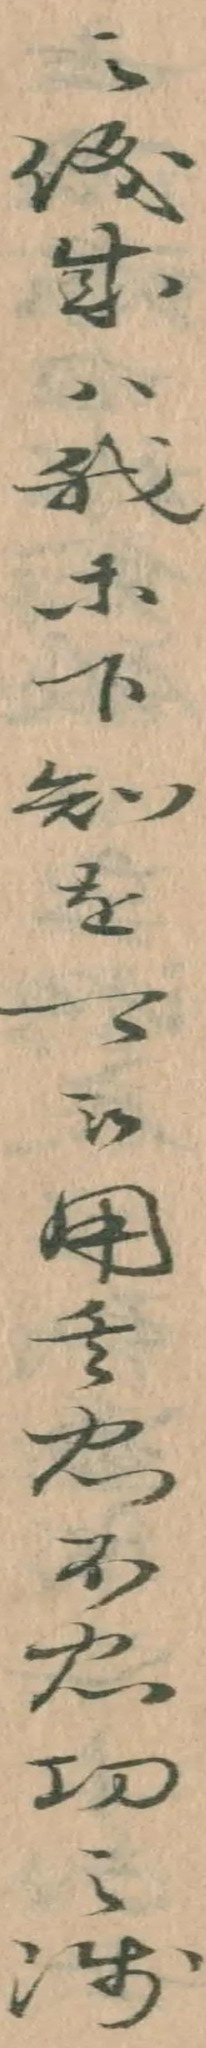之儀成は我等下知を可被用其忠不忠功之浅
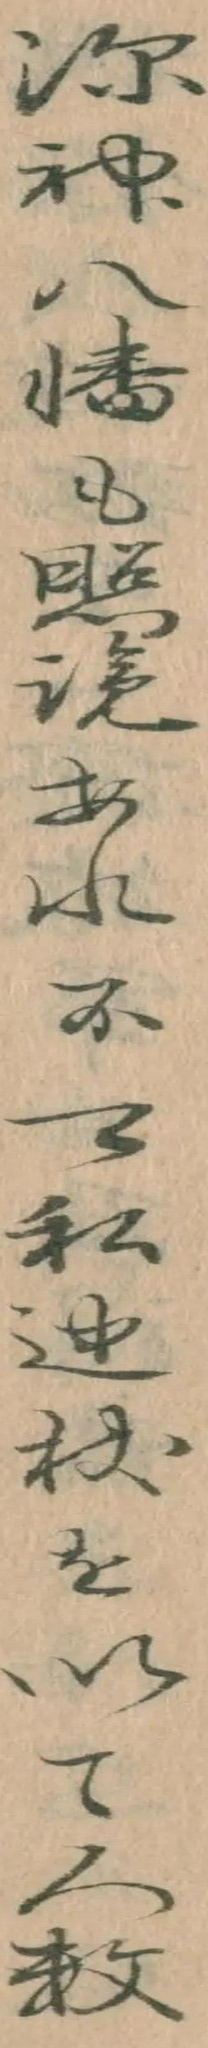深神八幡も照覧あれ不可私迚杖を以て人数
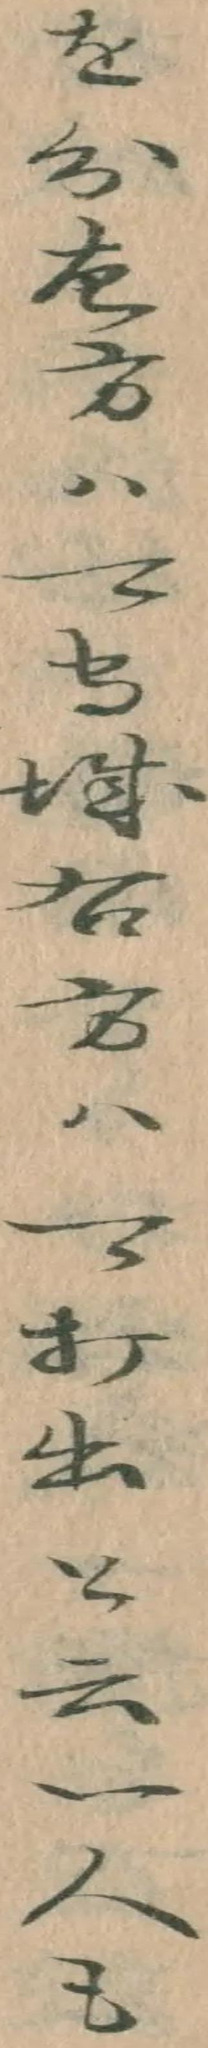を分左方は可守城右方は可打出と云一人も
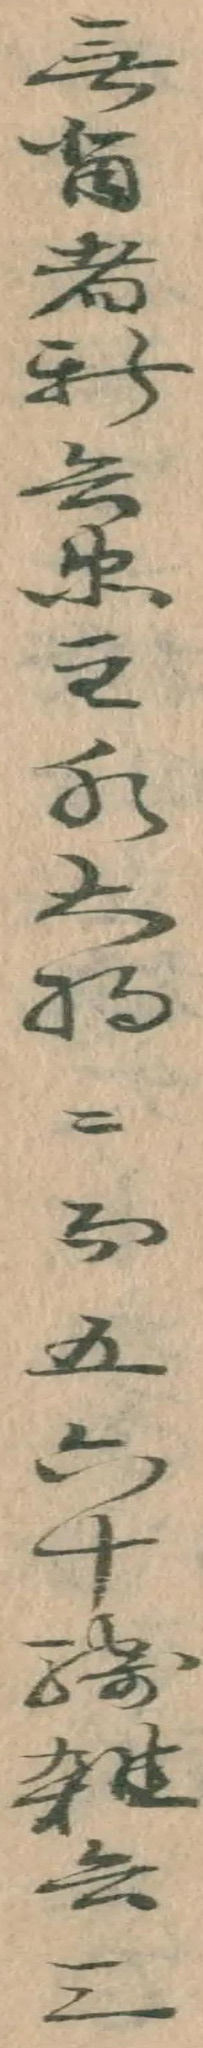無肖者新兵衛主水大将に而五六十騎雑兵三
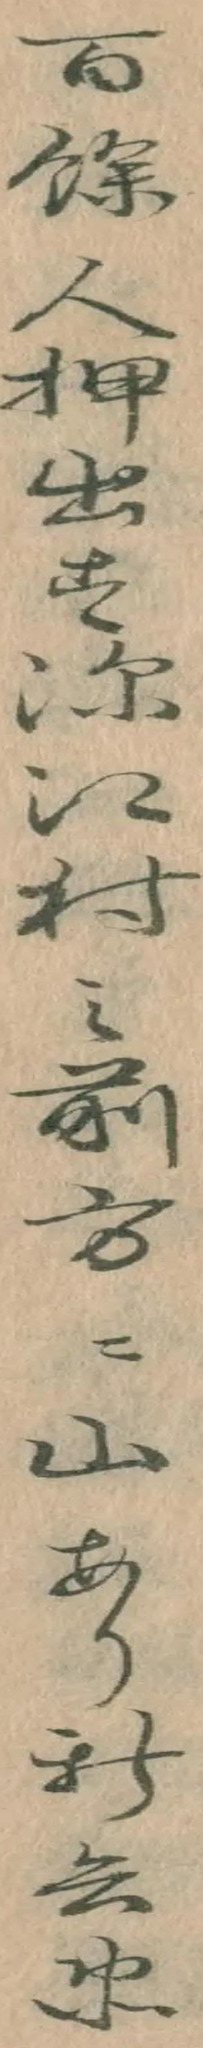百余人押出す深江村之前方に山あり新兵衛
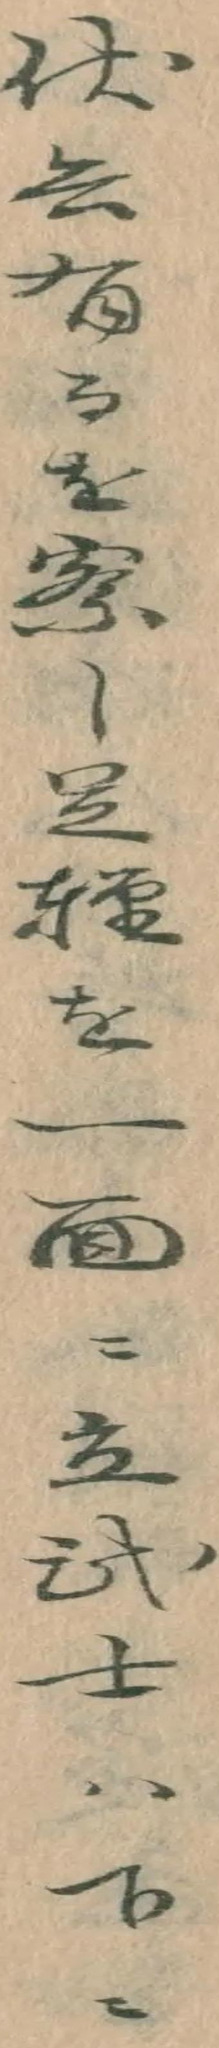伏兵有るを察し足軽を一面に立武士は下に
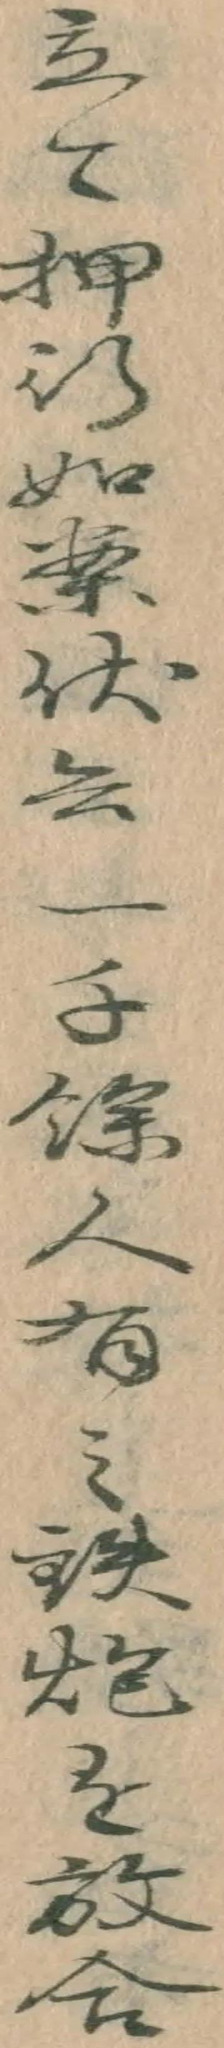立て押行如案伏兵一千余人有之鉄炮を放合
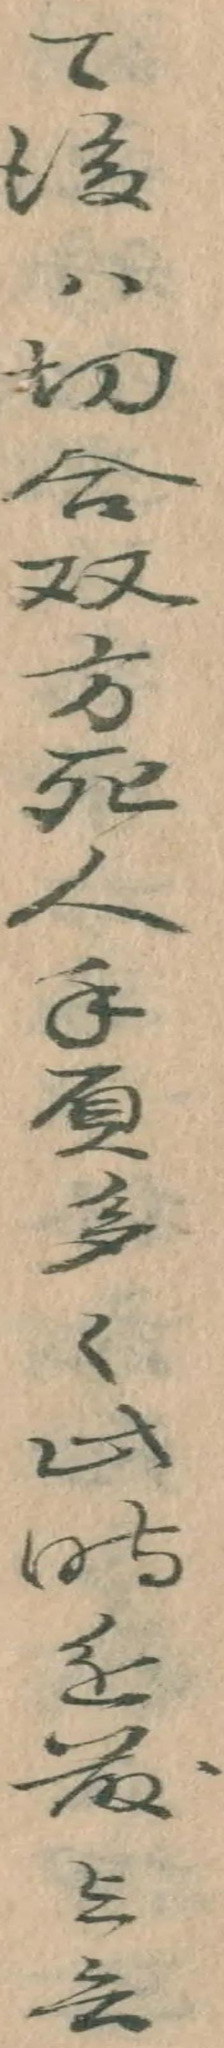て後は切合双方死人手負多く此時近藤与兵
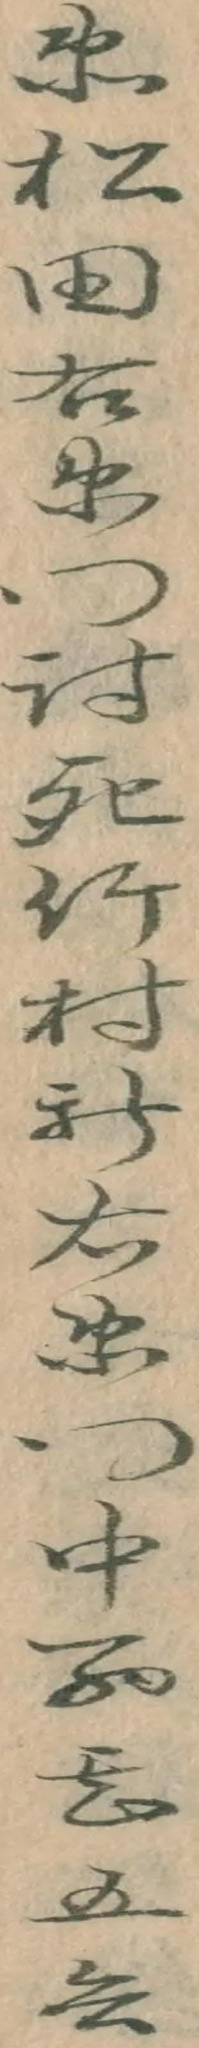衛松田右衛門討死竹村新右衛門中西甚五兵
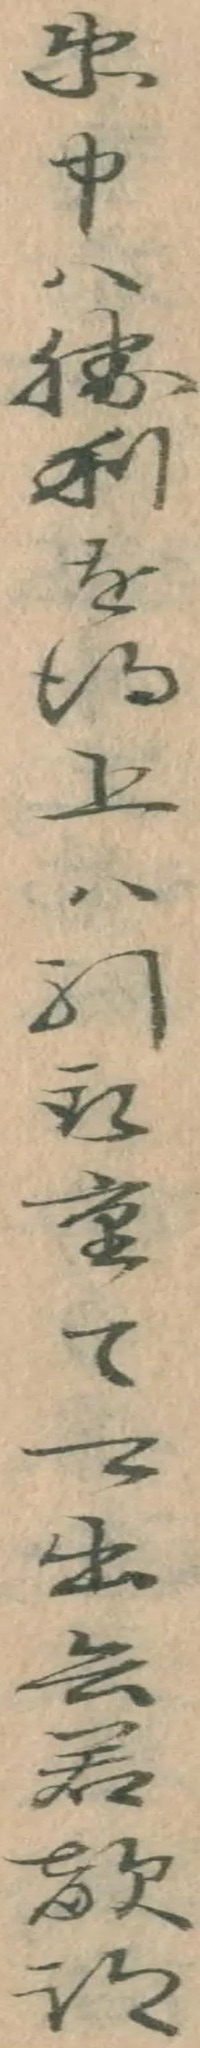衛申は勝利を得上は引取重て可出若敵跡

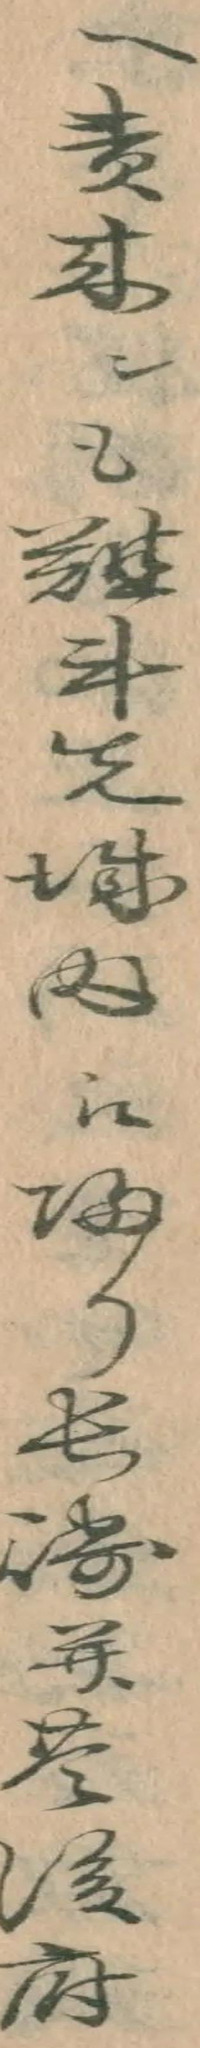へ責来んも難斗先城内え帰り長崎并豊後府
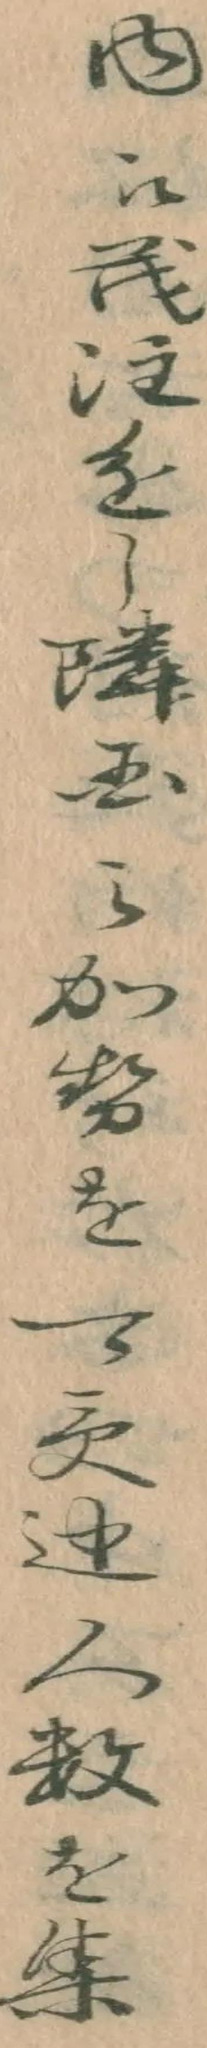内えも注進し隣国之加勢を可受迚人数を集
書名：切支丹御退治記 49巻. [1]
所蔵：国立国会図書館 National Diet Library, JAPAN
